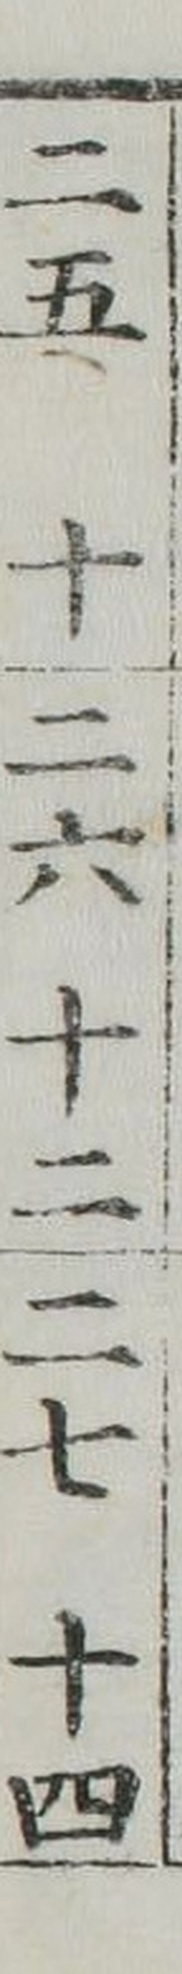二五十二六十二二七十四
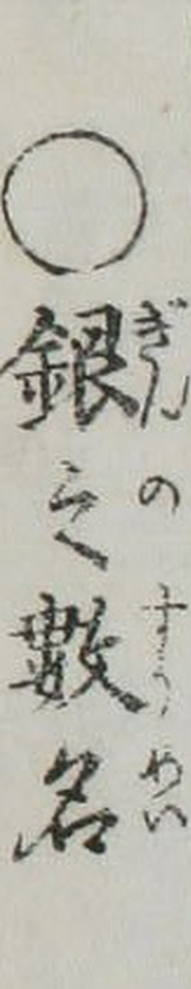○銀之数名
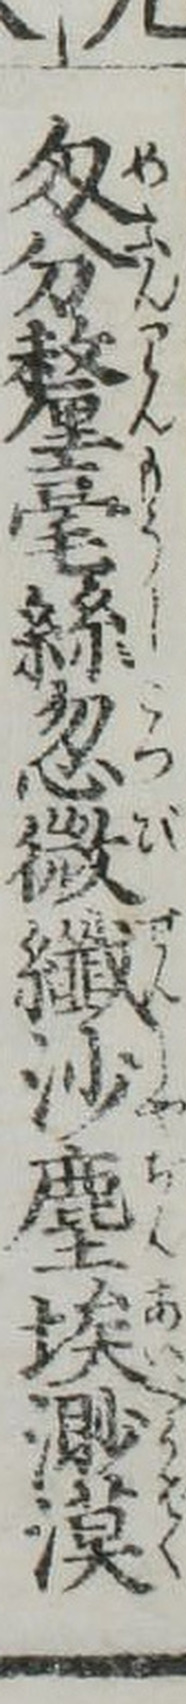匁分釐毫糸忽微繊沙塵埃渺漠
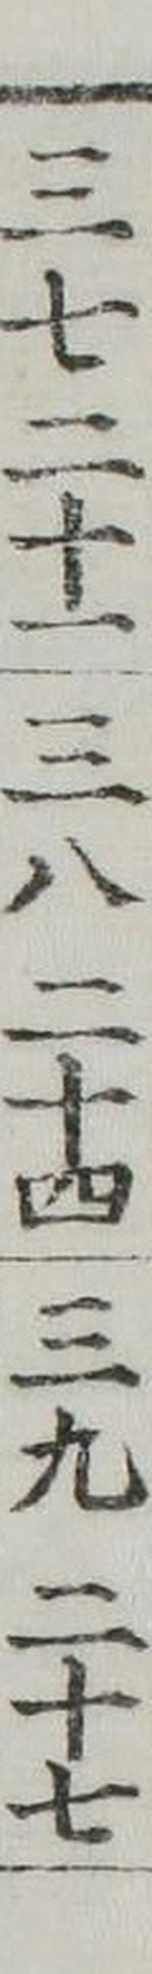三七二十一三八二十四三九二十七
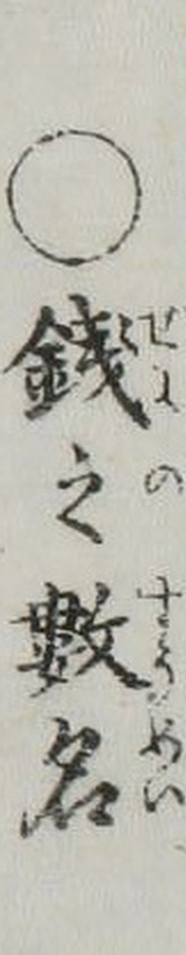○銭之数名
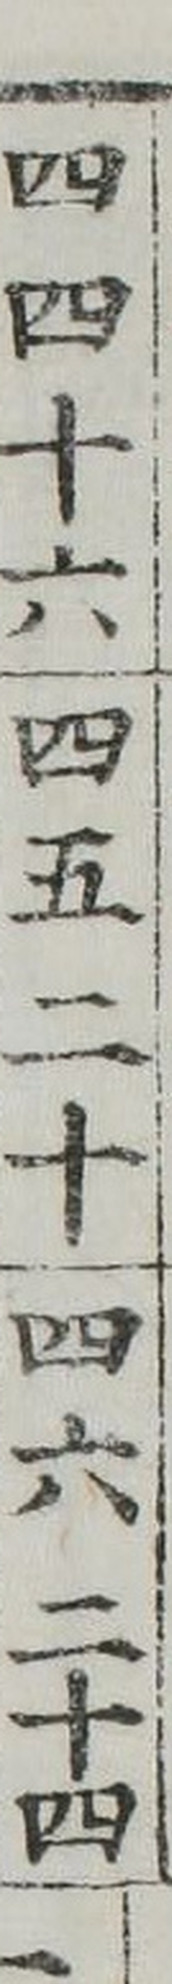四四十六四五二十四六二十四
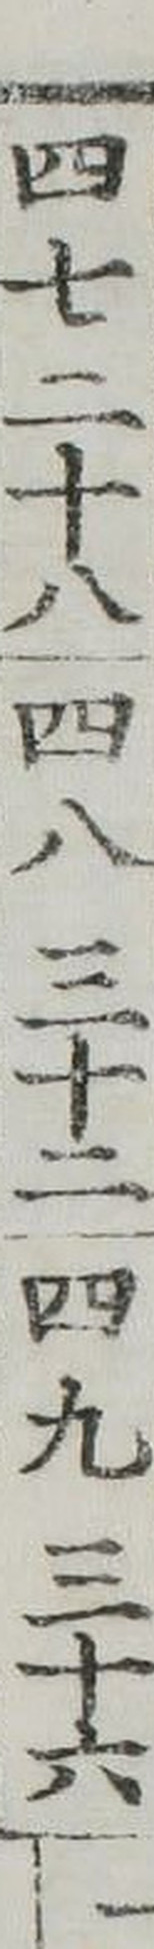四七二十八四八三十二四九三十六
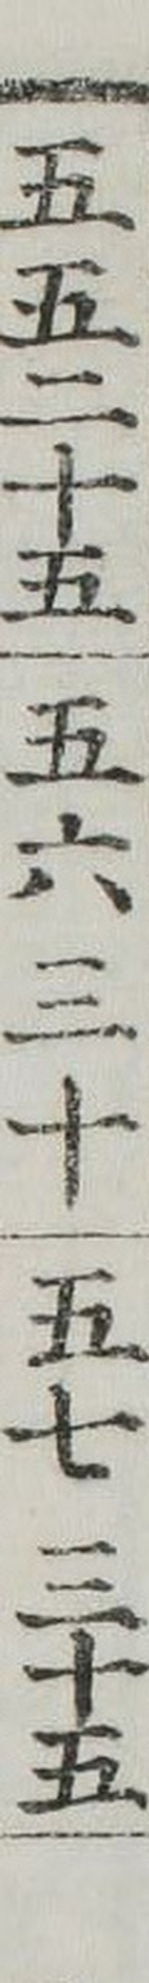五五二十五五六三十五七三十五
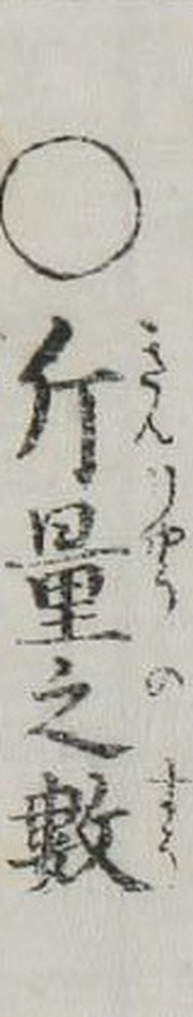○斤量之数
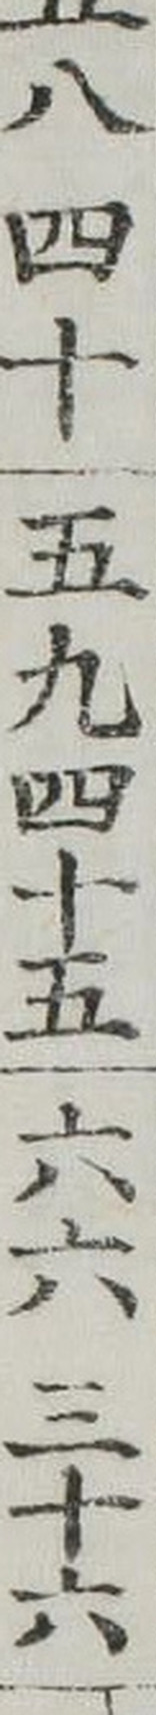五八四十五九四十五六六三十六
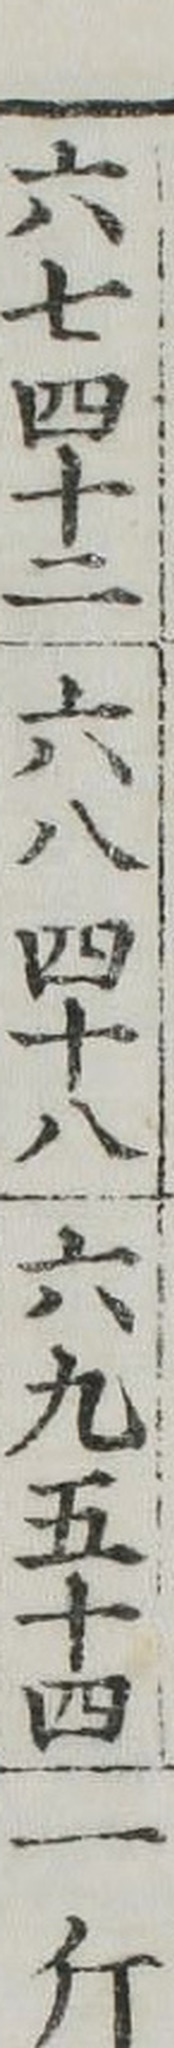六七四十二六八四十八六九五十四
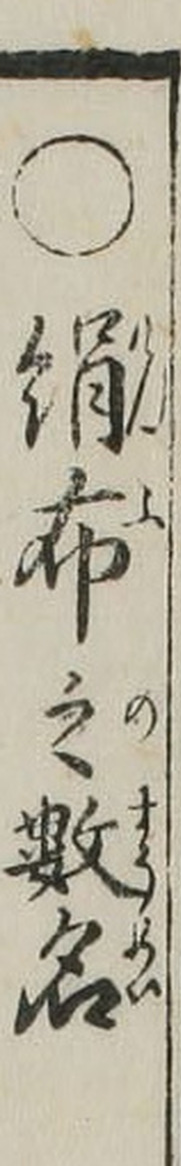○絹布之数名
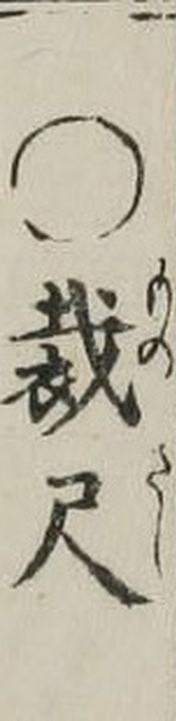○裁尺
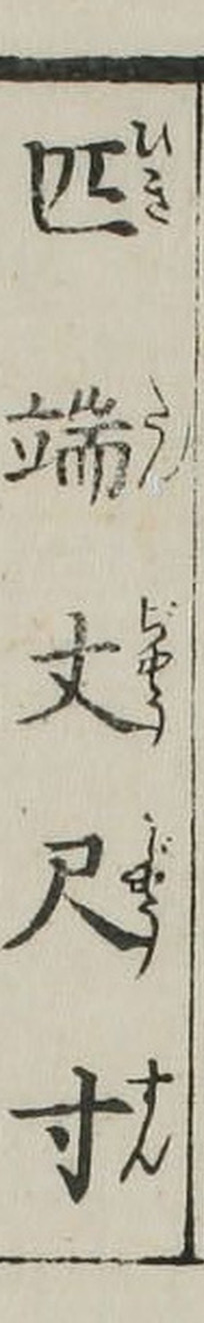匹端丈尺寸
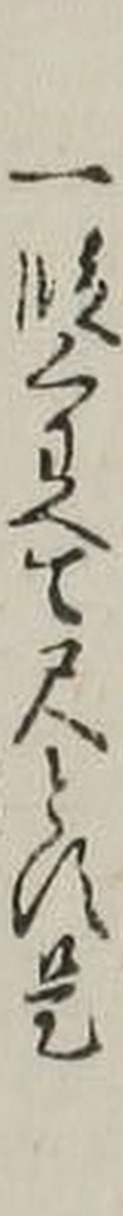一段くわへて尺とす是
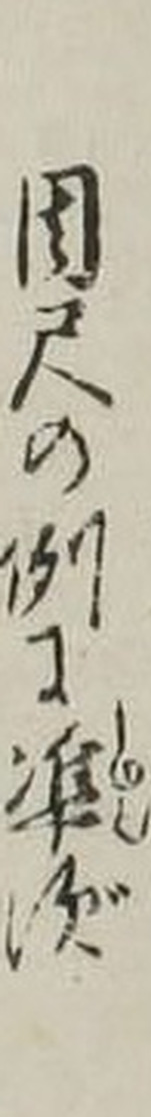周尺の例に準ず
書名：宝玉塵劫記
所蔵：東京学芸大学教育コンテンツアーカイブ
